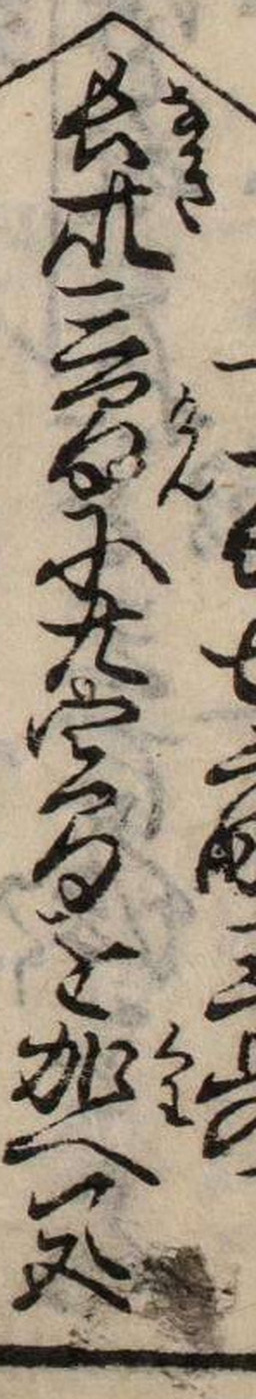長丗三間に廿四間を加へて五
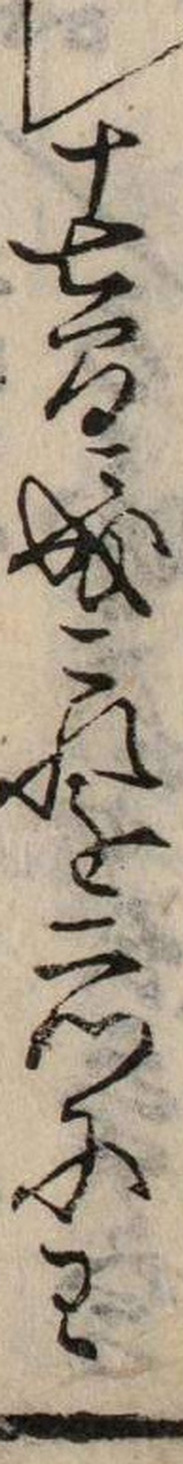十七間に成これを二つにわ
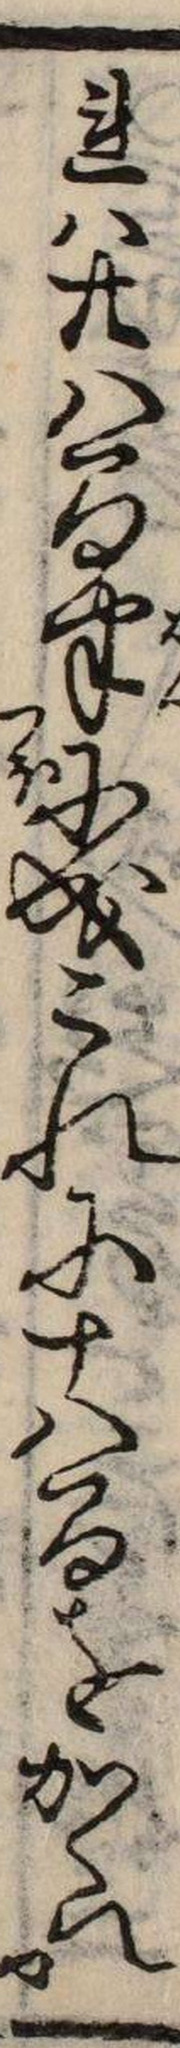れは廿八間半に成これに十八間をかくれ
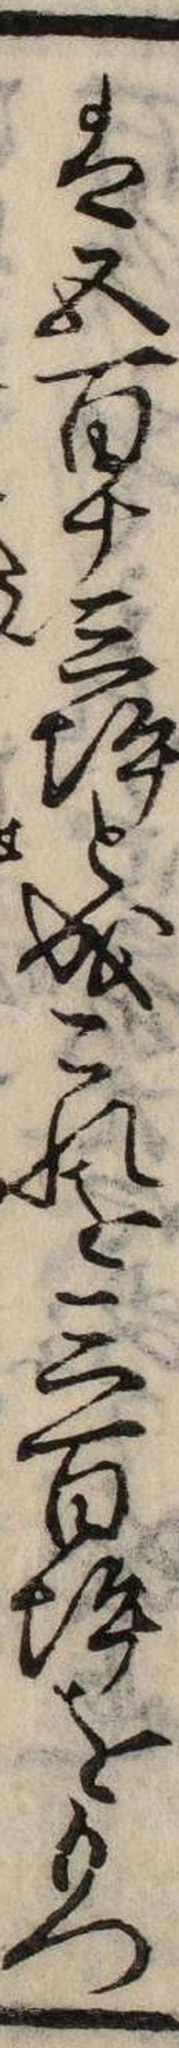は五百十三坪と成これを三百坪をもつ
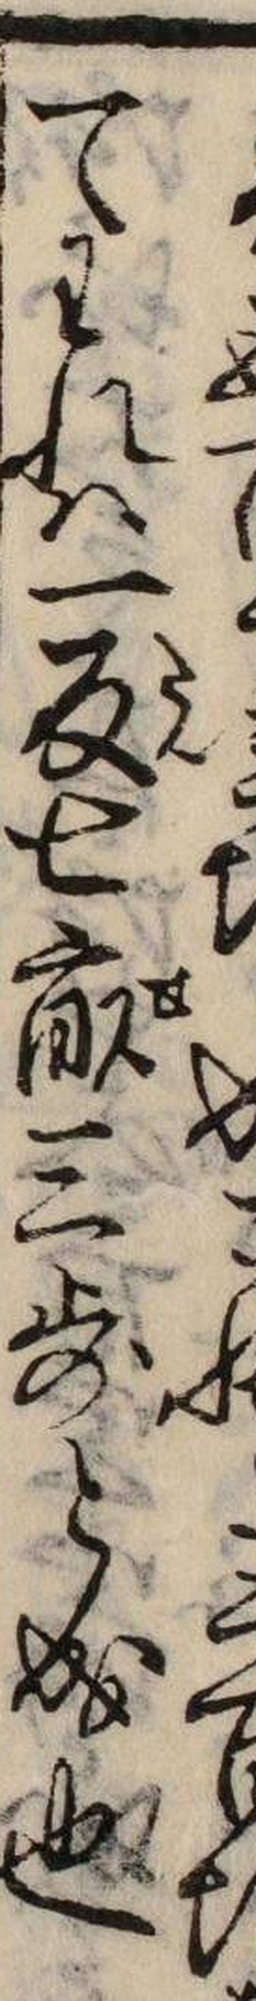てわれは一反七畝三歩と成也
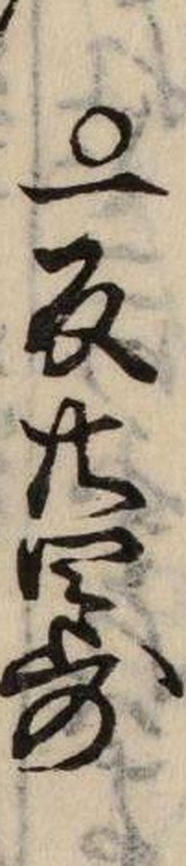○一反廿四歩
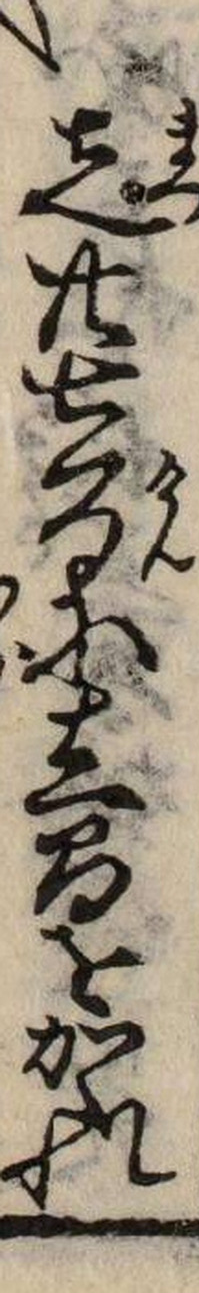先廿七間に十二間をかくれ
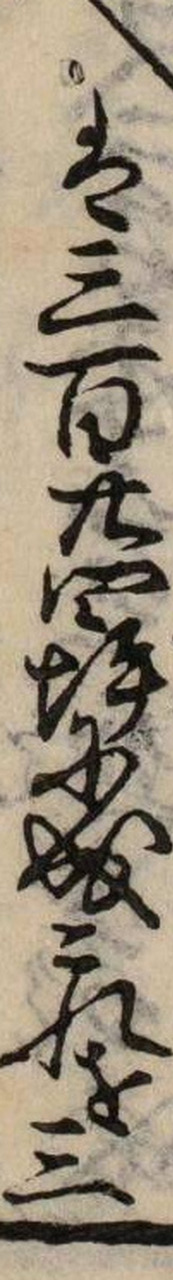は三百廿四坪に成これを三
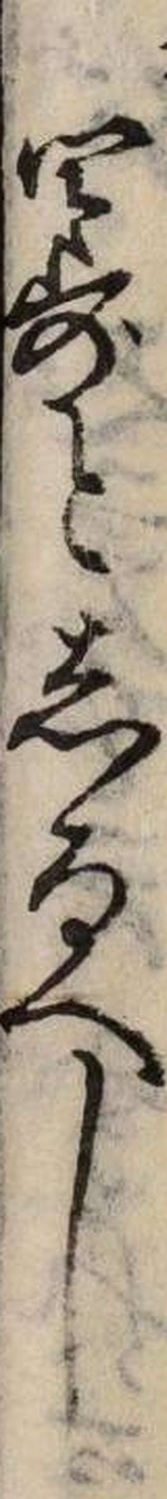四歩としるへし
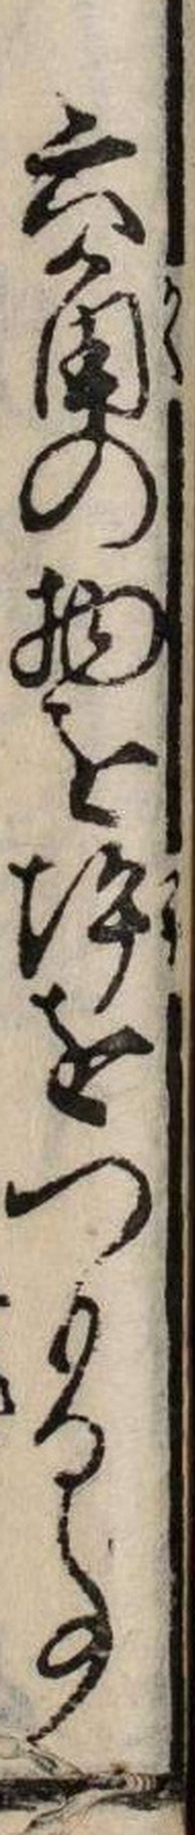六角の物を坪をつもる事
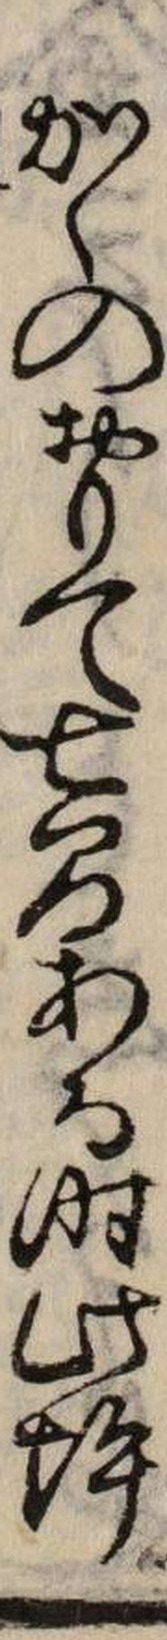かくのおもて七間ある時此坪
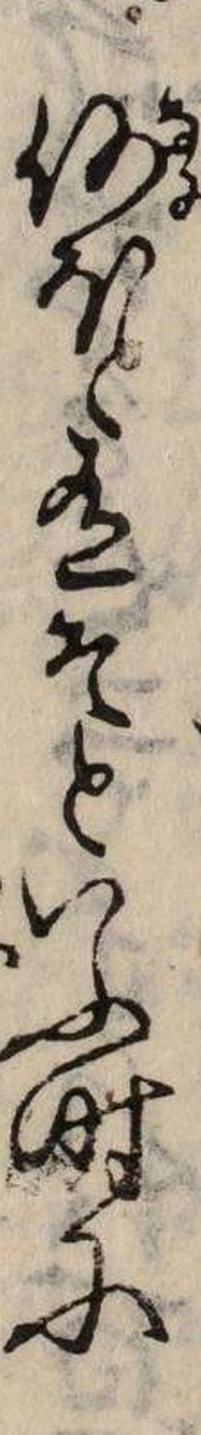何ほと有そといふ時に
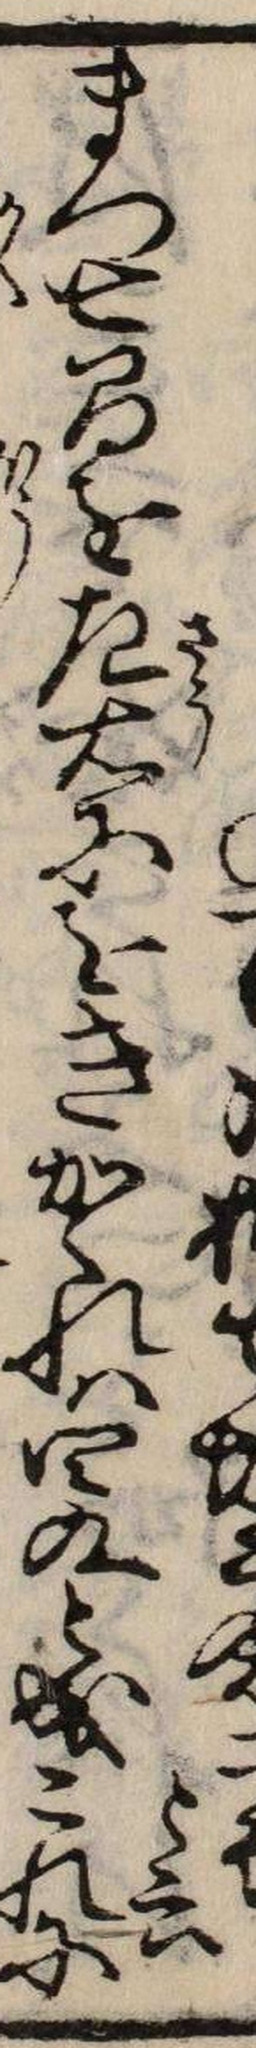まつ七間を左右にをきかくれは四九と成これに
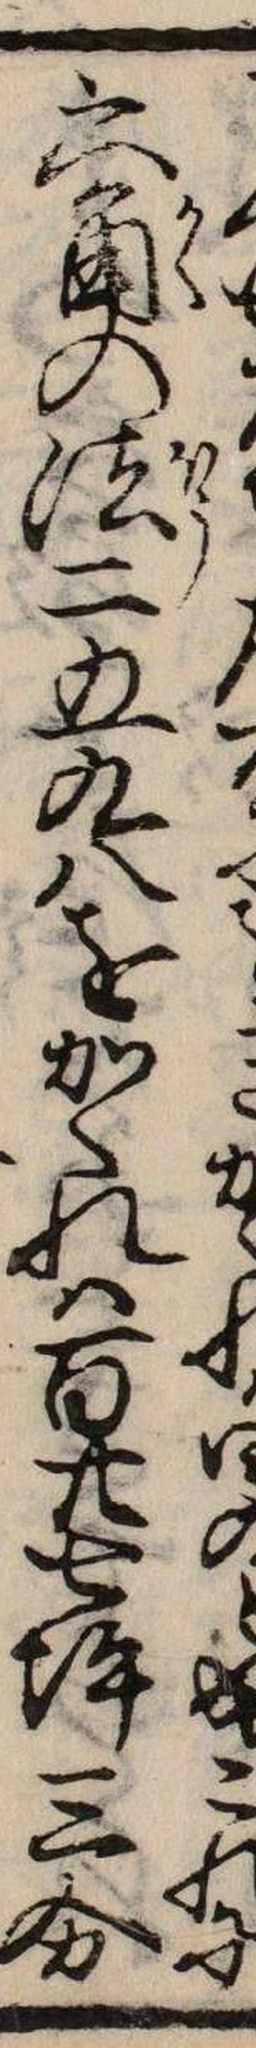六角の法二五九八をかくれは百廿七坪三分
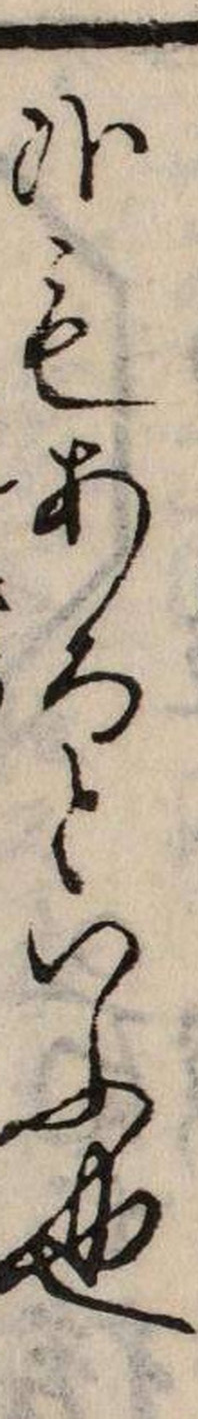弐毛あるといふ也
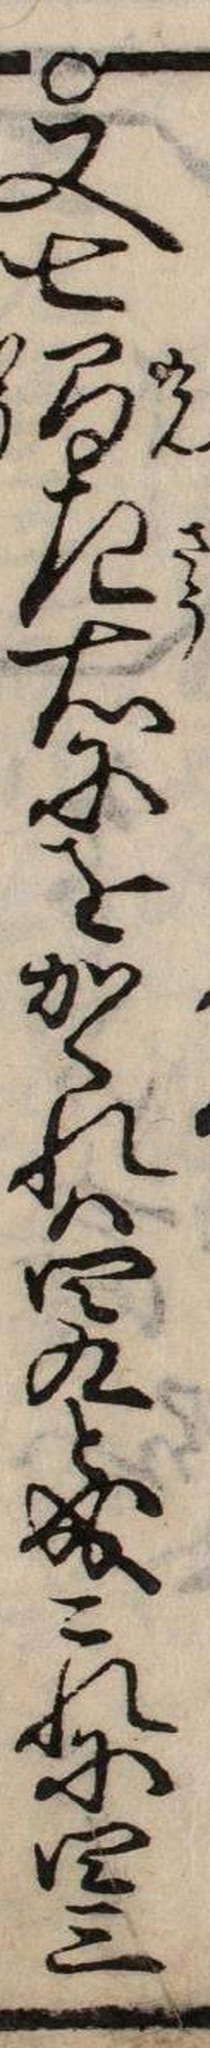○又七間左右にをかくれは四九と成これに四三
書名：塵劫記（寛永11年自跋、京都府立京都学・歴彩館追貴8）
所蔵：京都府立京都学・歴彩館 国文学研究資料館
